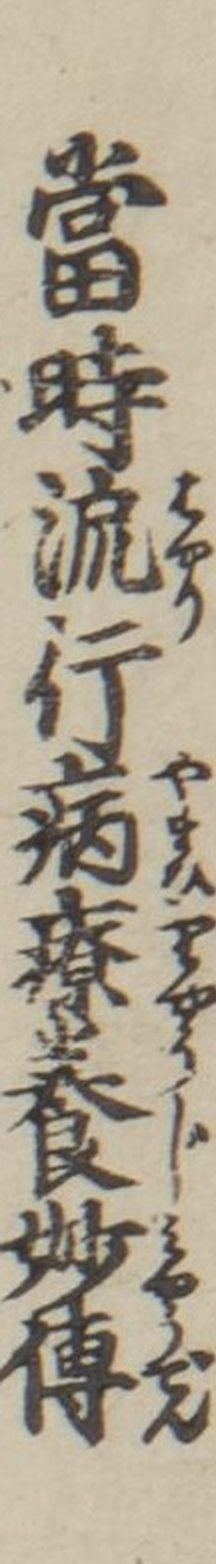当時流行病療養妙伝
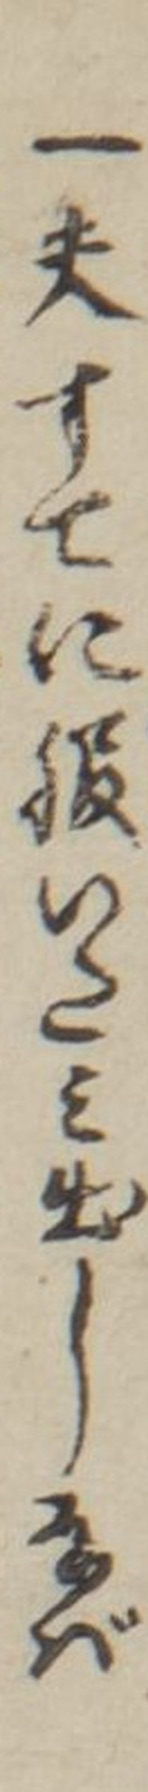一夫すてに腹いたみ出しなば
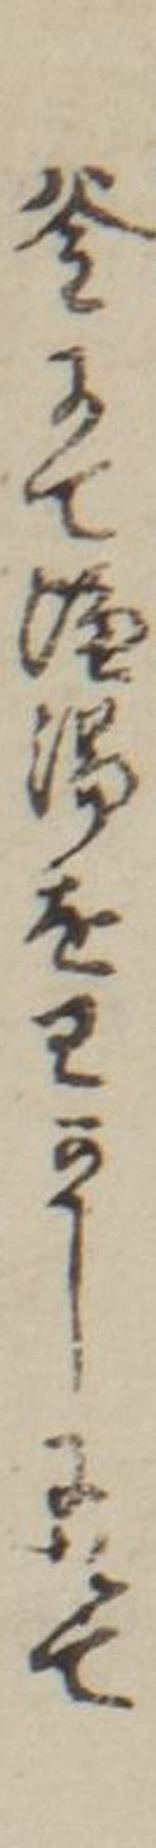釜にて塩湯をわかしにたて
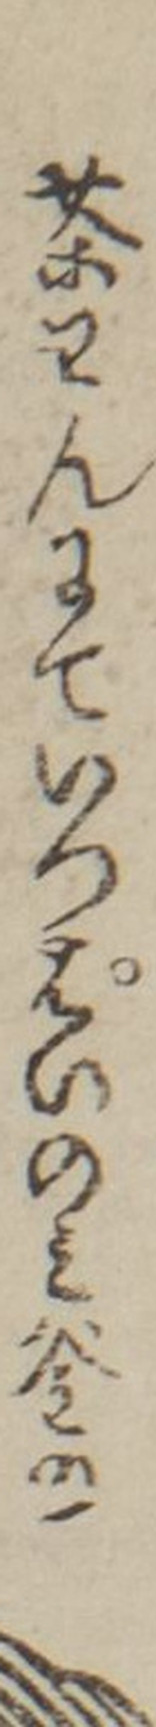茶わんにていつぱいのみ釜の
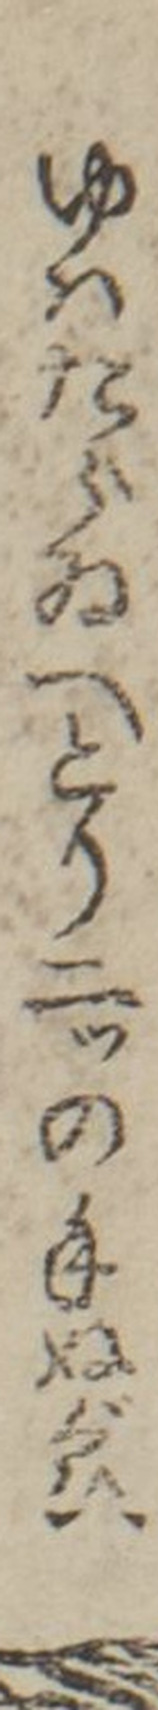ゆはたらゐへとり二ッの手ぬぐひ
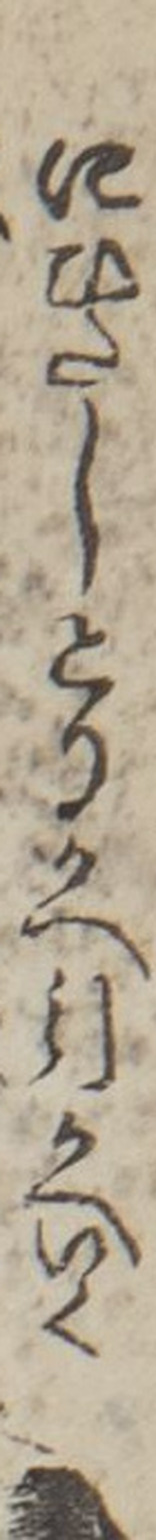にひたしとりかへ引かへいく
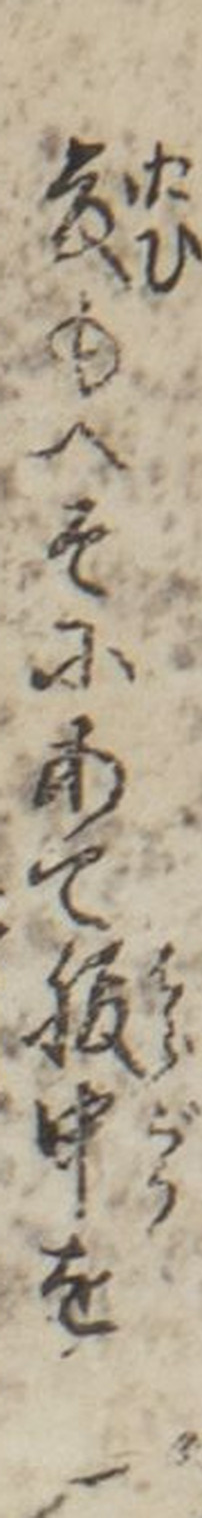度もへそにあて腹中を
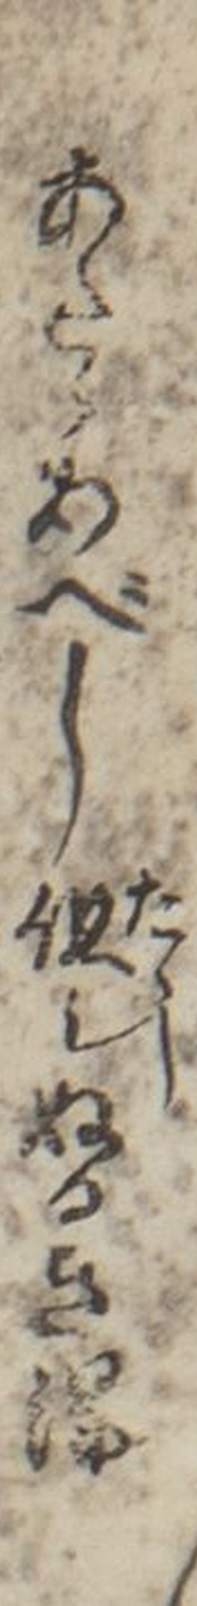あたゝめべし但しぬるき湯
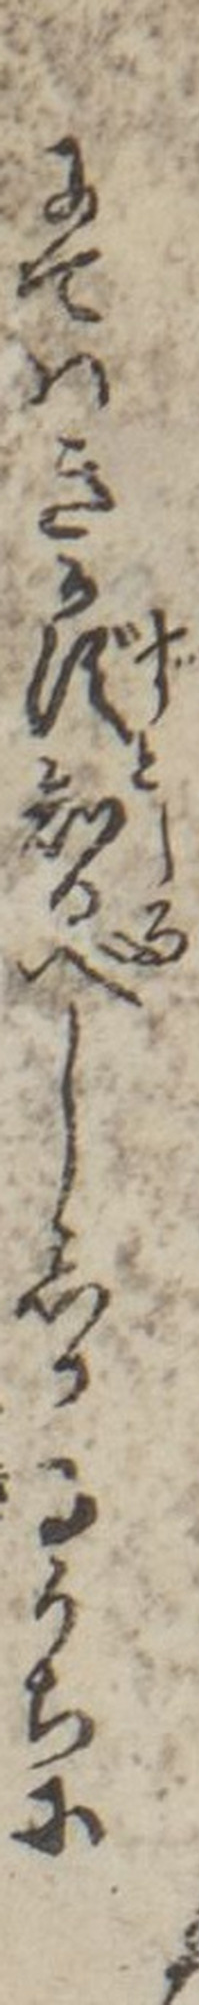にてはきか須と知るべししかるうちに
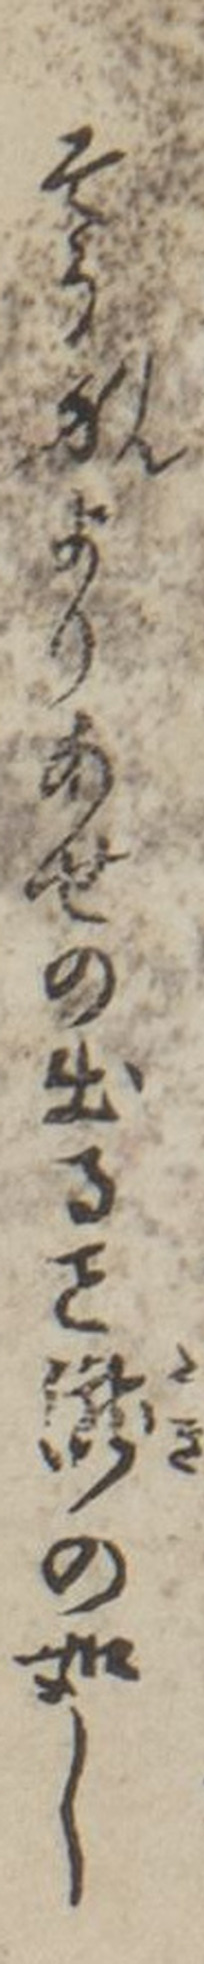そう身よりあせの出ること瀧の如し
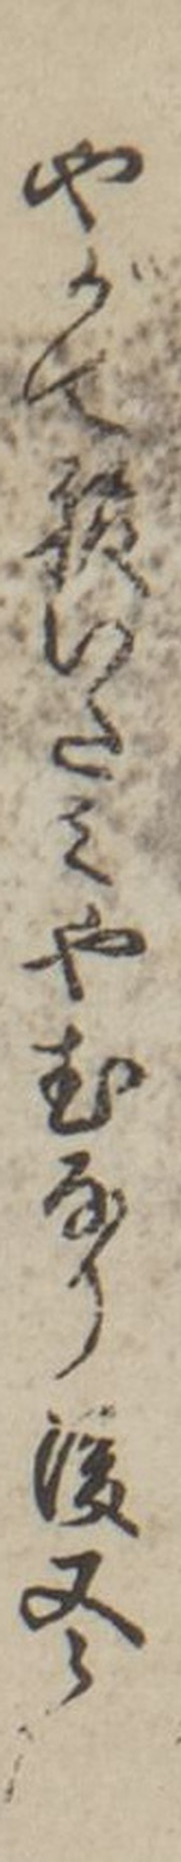やがて腹いたみやむなり後又々
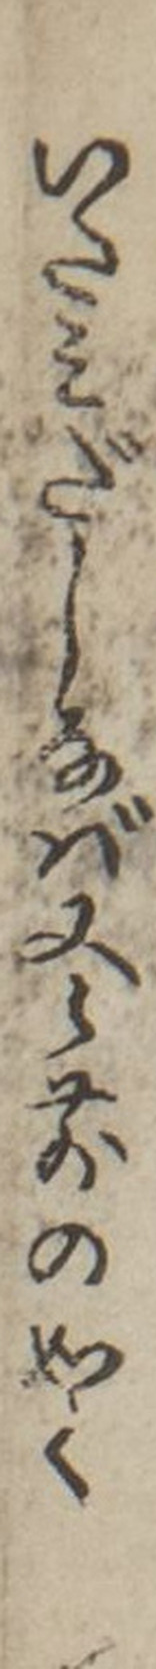いたみだしなば又々前の如く
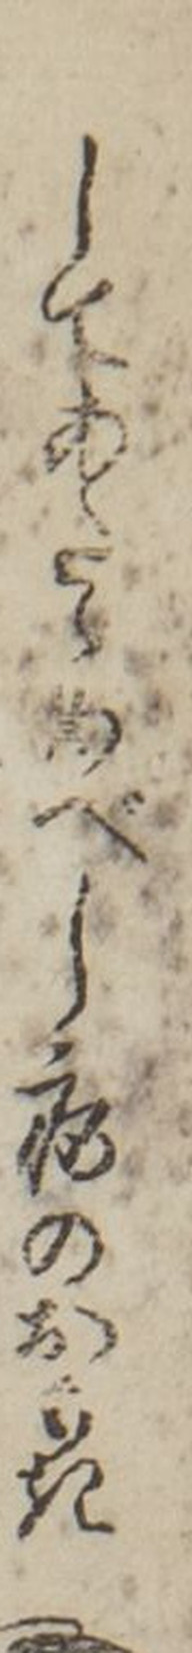してあたゝめべし病のおもき
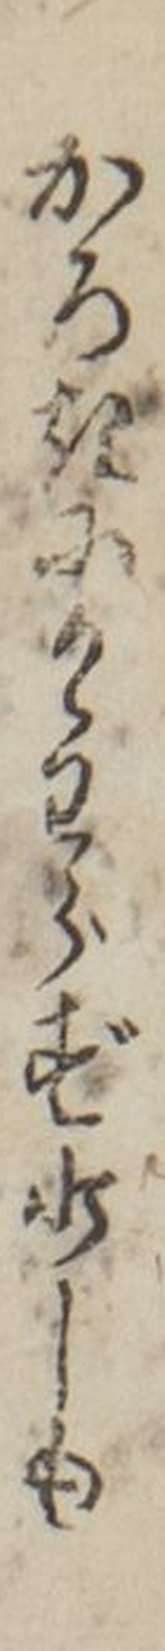かろきにかゝわらず少しも
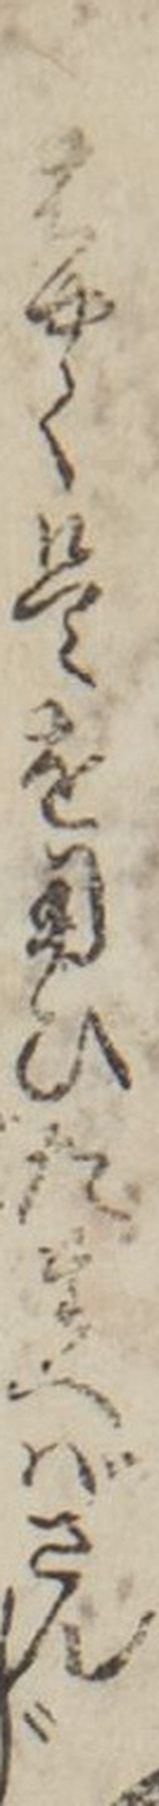はやく是を用ひたまへばさんじ
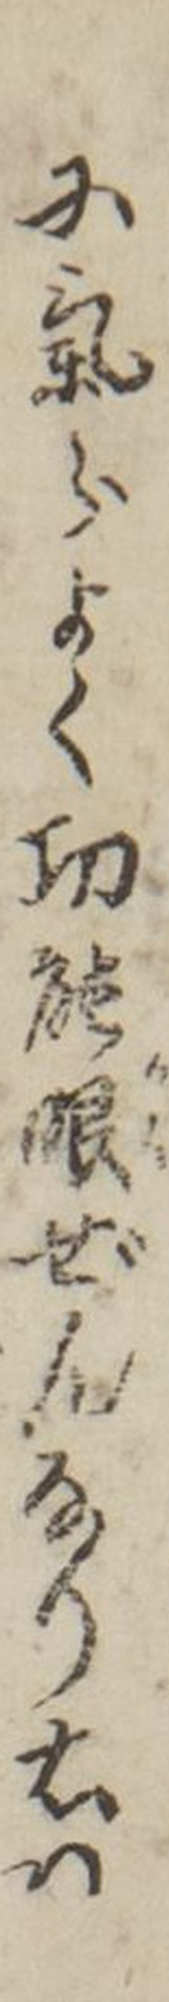に気分よく功能眼ぜんなり右は
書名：当時流行病療養妙伝
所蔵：あいおいニッセイ同和損保株式会社
